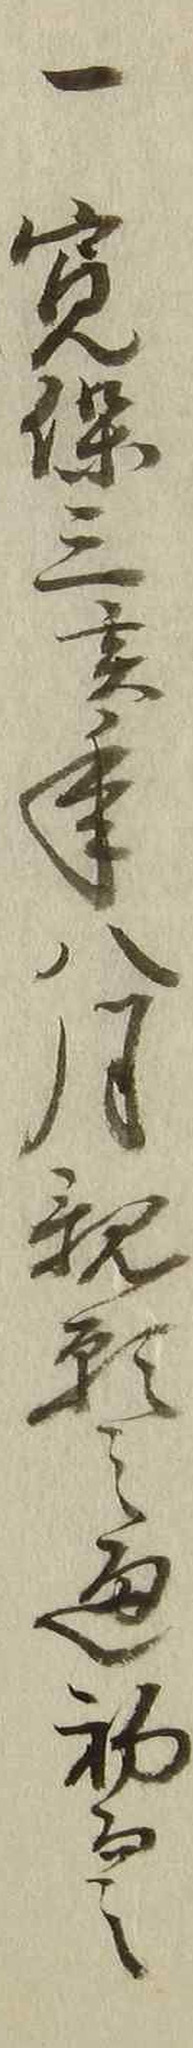一寛保三亥年八月親願之通初而之
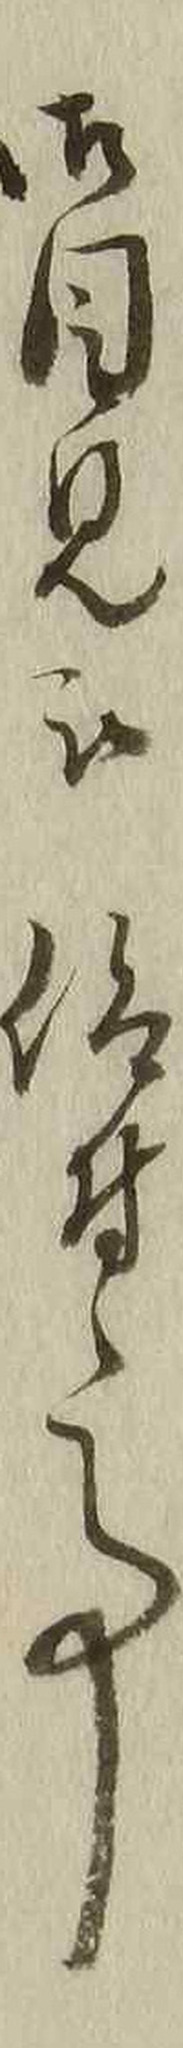御目見被仰付候事
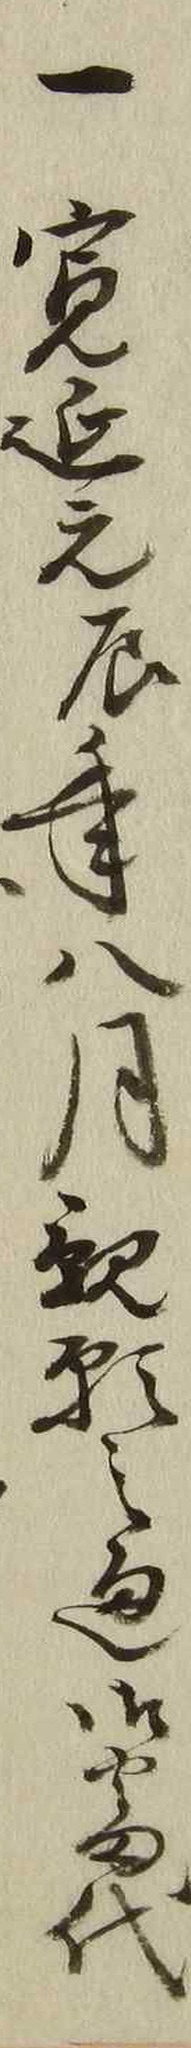一寛延元辰年八月親願之通御番代
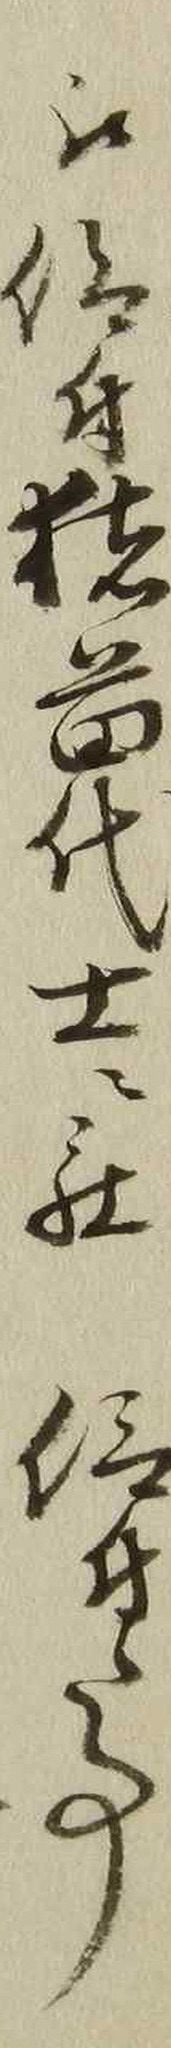被仰付猪苗代士ニ被仰付候事
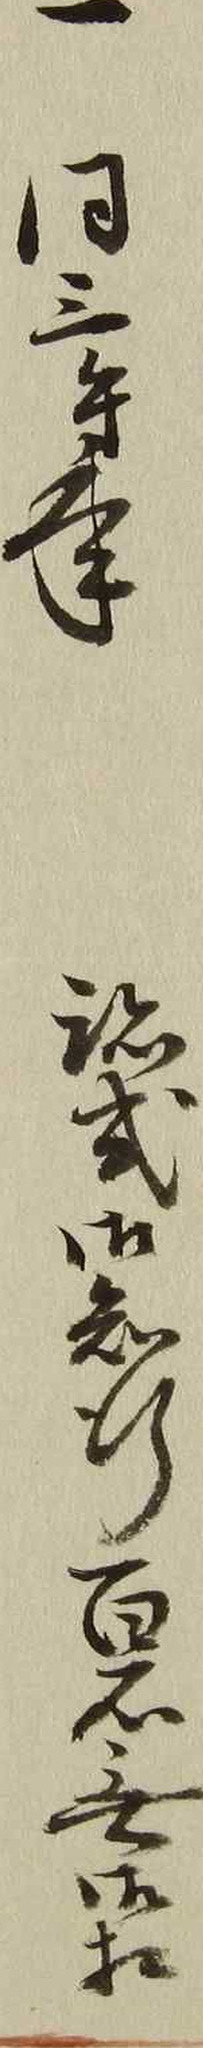一同三午年跡式御知行百石無御相
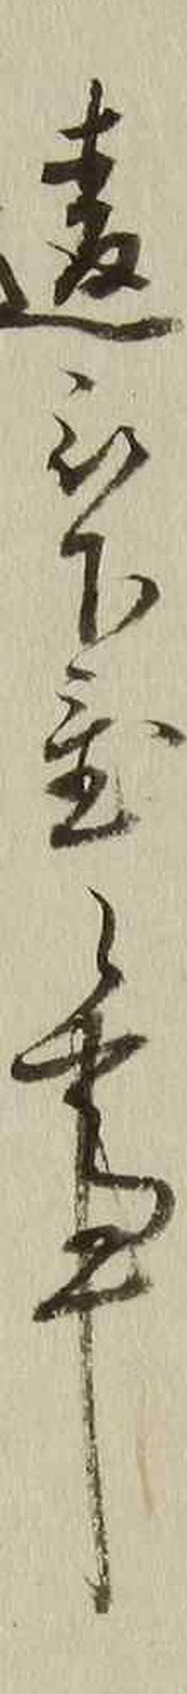違被下置候事
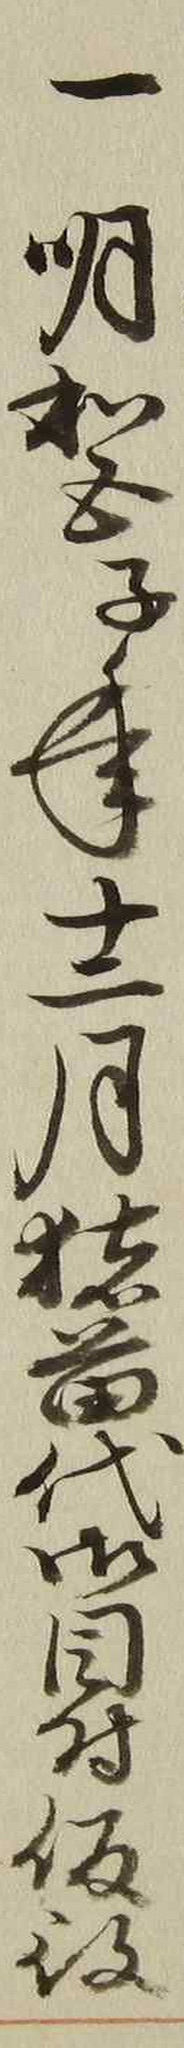一明和五子年十二月猪苗代御目付仮役
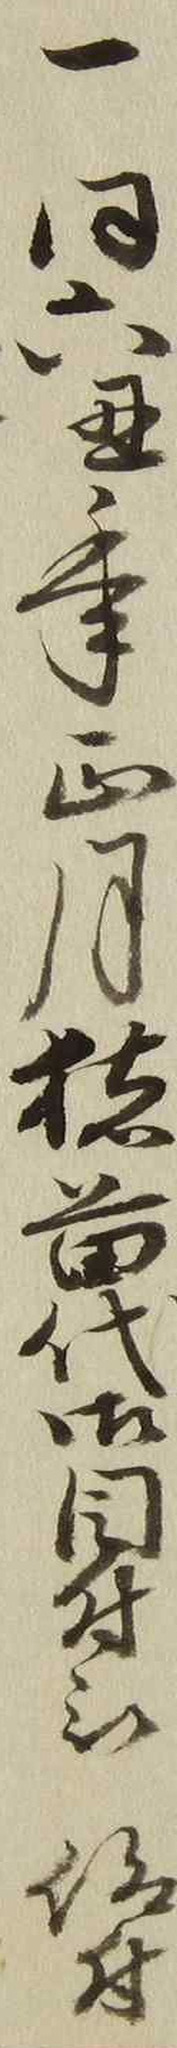一同六丑年正月猪苗代御目付被仰付
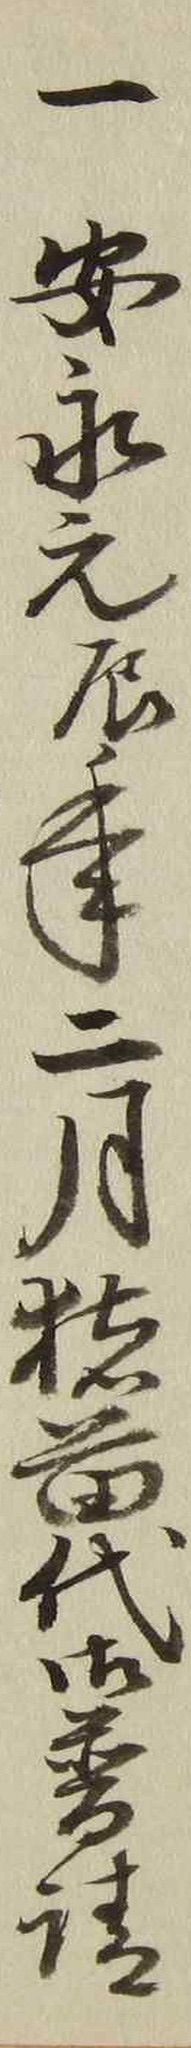一安永元辰年二月猪苗代御普請
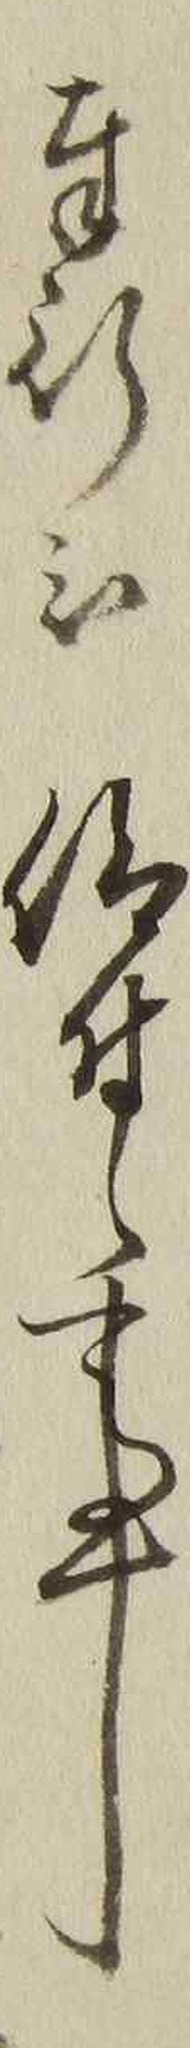奉行被仰付候事
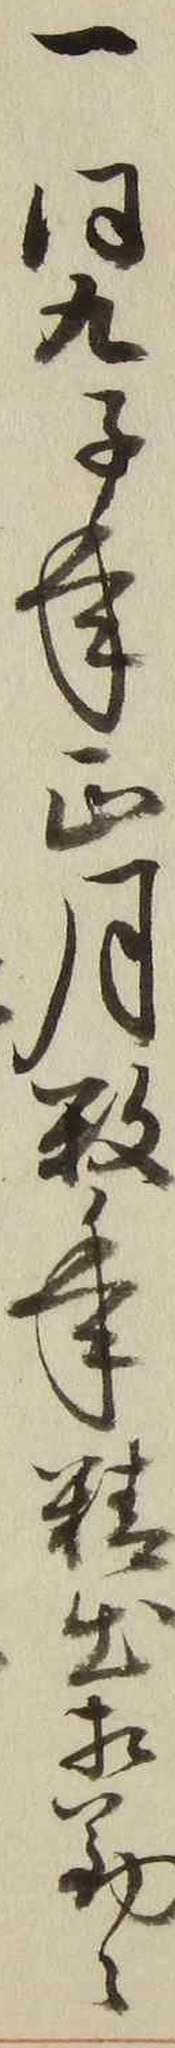一同九子年正月数年精出相勤候
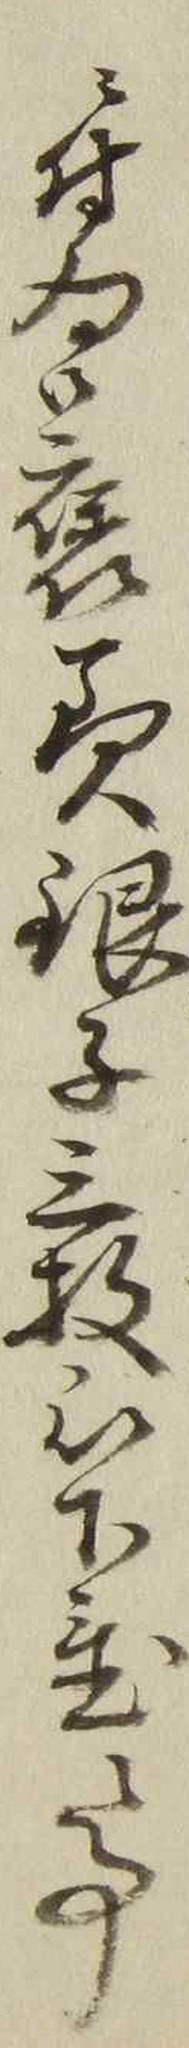ニ付為御褒美銀子三枚被下置候事
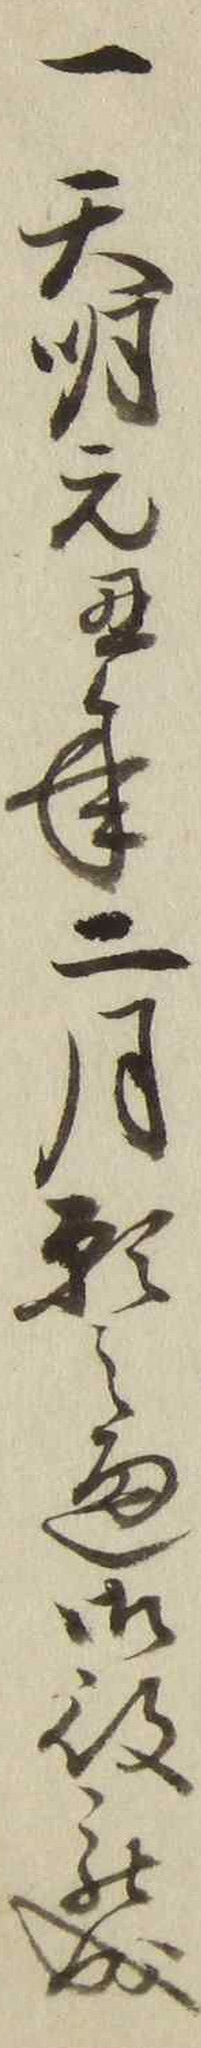一天明元丑年二月願之通御役被成

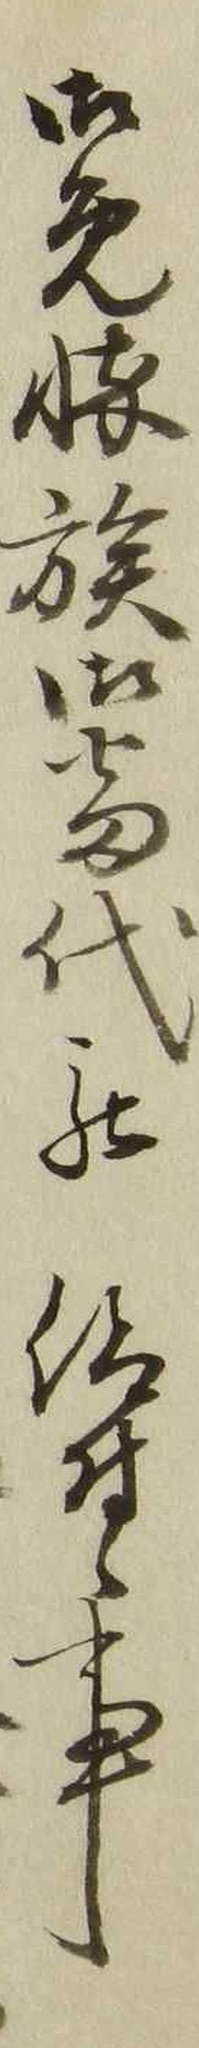御免忰族御番代被仰付候事
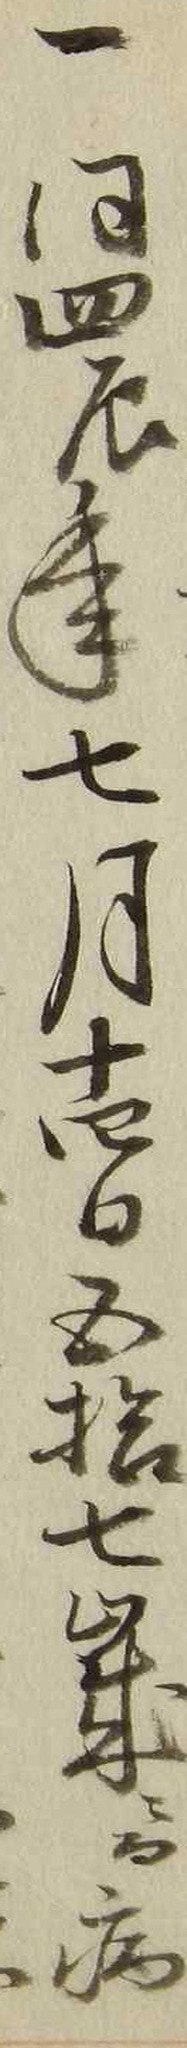一同四辰年七月十四日五拾七歳ニ而病
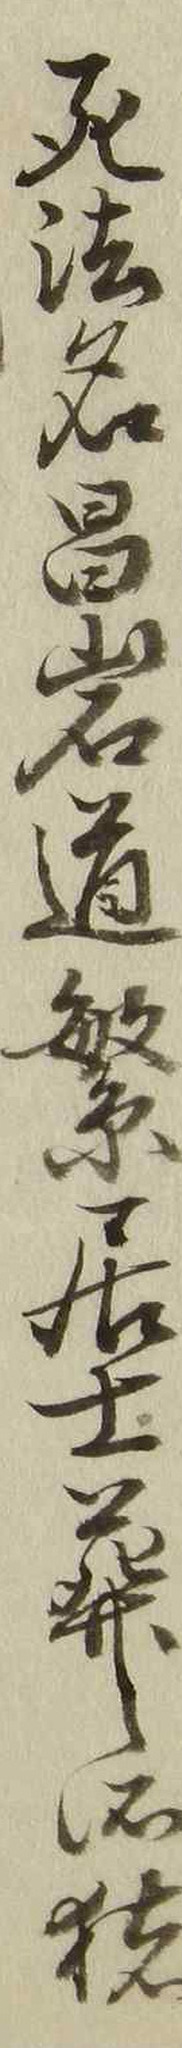死法名昌岩道繁居士葬所猪
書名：諸士系譜　巻之53　に之部4
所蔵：会津若松市立会津図書館
